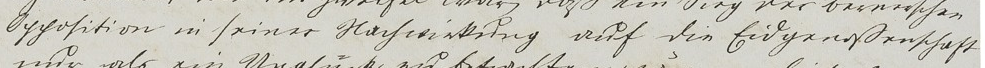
Opposition in seiner Nachwirkung auf die Eidgenossenschaft
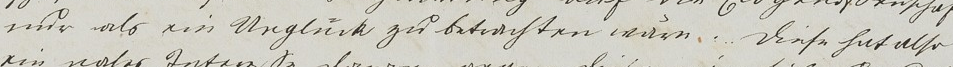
nur als ein Unglück zu betrachten wäre. Diese hat also
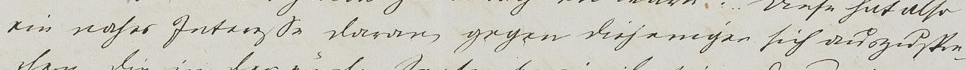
ein nahes Interesse daran, gegen diejenigen sich auszuspre-
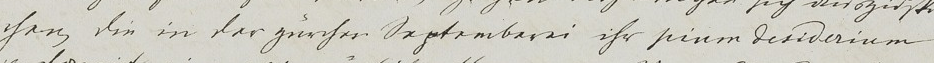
chen, die in der zürcher Septemberei ihr pium desiderium
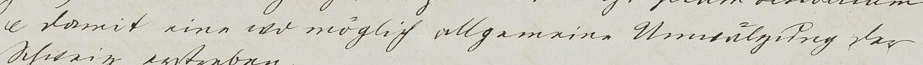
& damit eine wo möglich allgemeine Umwälzung der
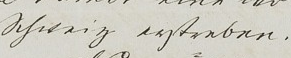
Schweiz erstreben.
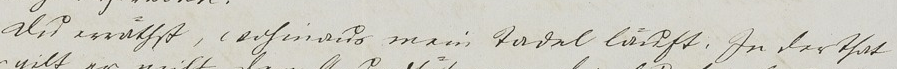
Du erräthst, wohinaus mein Tadel läuft. In der That
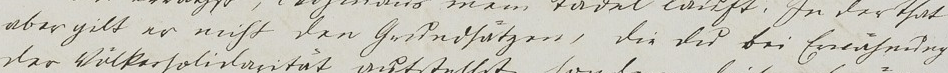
aber gilt er nicht den Grundsätzen, die du bei Erwähnung
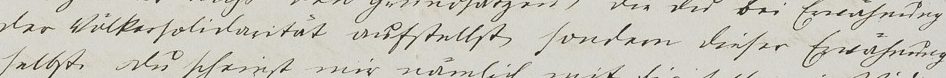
der Völkersolidarität aufstellst, sondern dieser Erwähnung
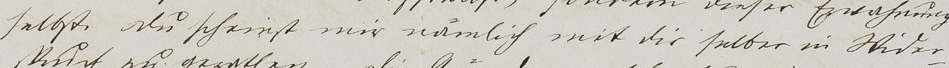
selbst. Du scheinst mir nämlich mit dir selber in Wider-
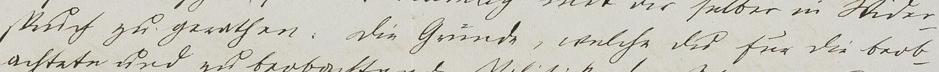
spruch zu gerathen. Die Gründe, welche du für die beob-
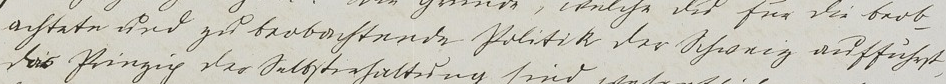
achtete und zu beobachtende Politik der Schweiz aufführst,
